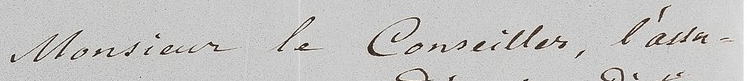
Monsieur le Conseiller, l'assu-
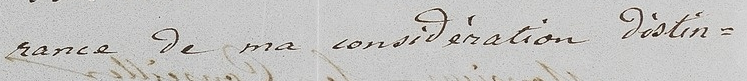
rance de ma considération distin-
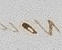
G. H.
